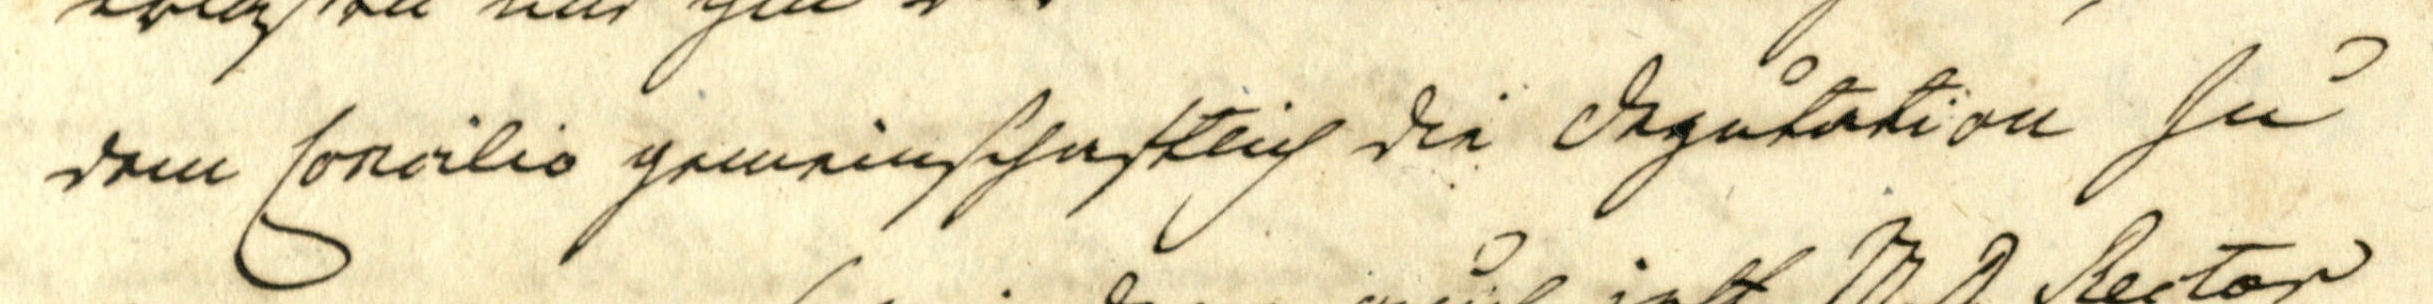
dem Concilio gemeinschaftich die Deputation zu
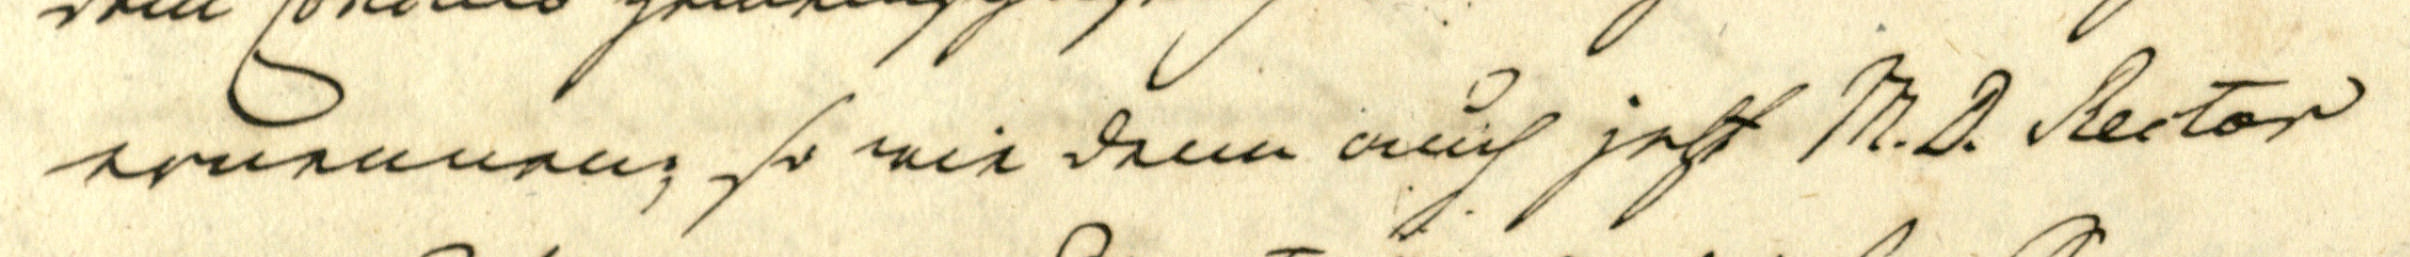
ernennen, so wie denn auch jetzt M. D. Rector
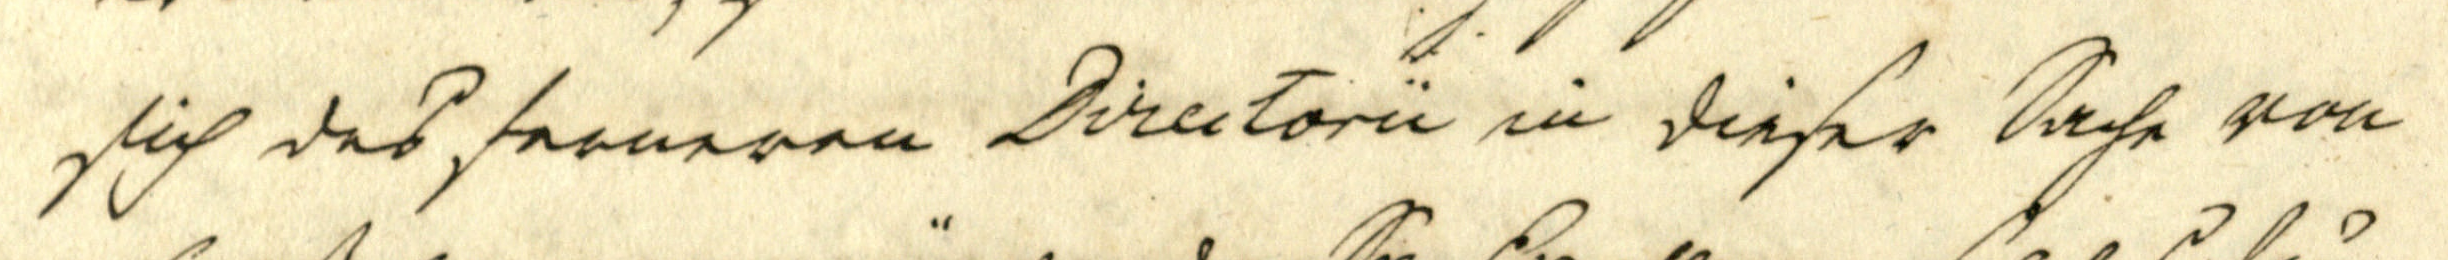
sich des ferneren Directorii in dieser Sache von
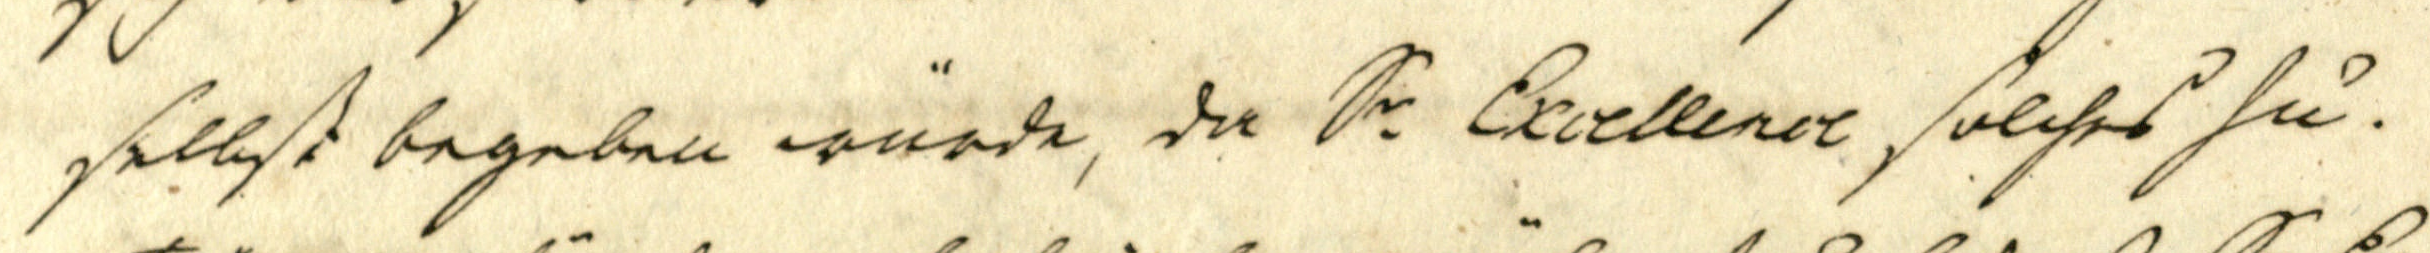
selbst begeben würde, da Sr. Excellence solches zu¬
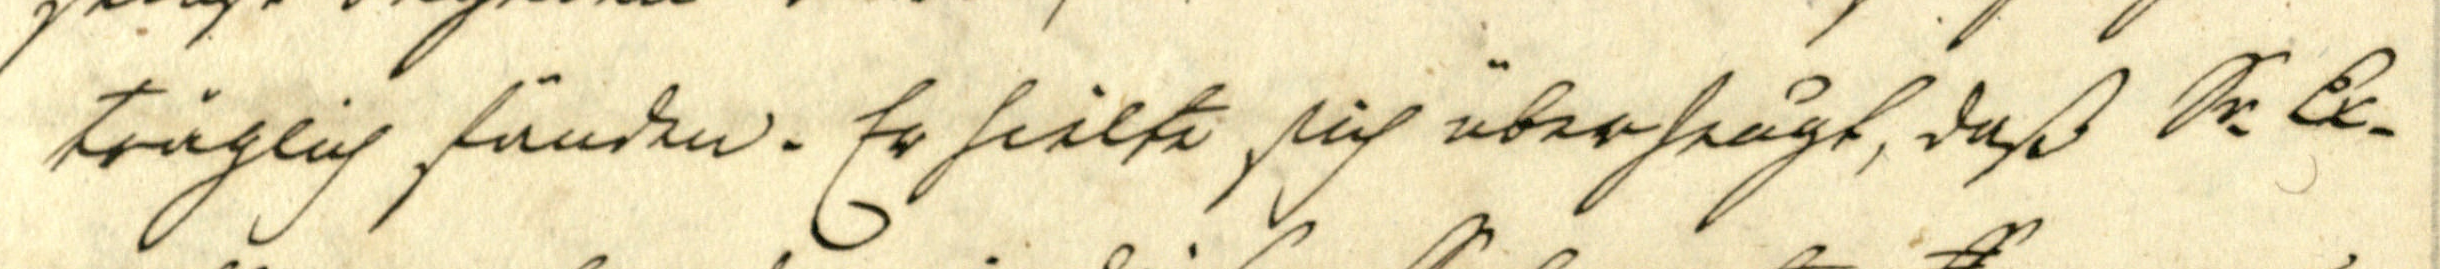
träglich fänden. Er hielte sich überzeugt, daß Sr Ex¬
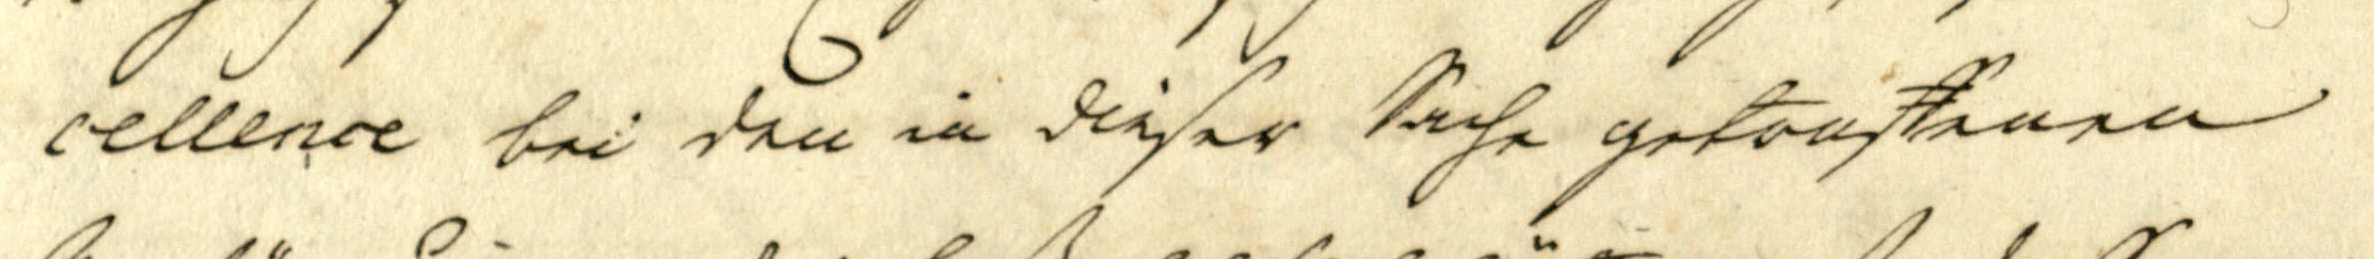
cellence bei den in dieser Sache getroffenen
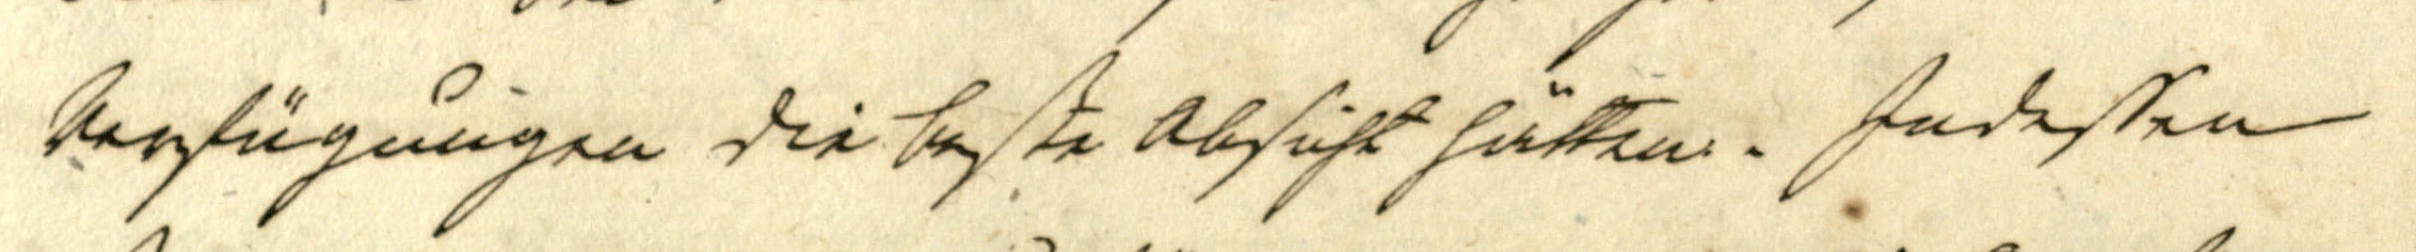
Verfügungen die beste Absicht hätten. Indessen
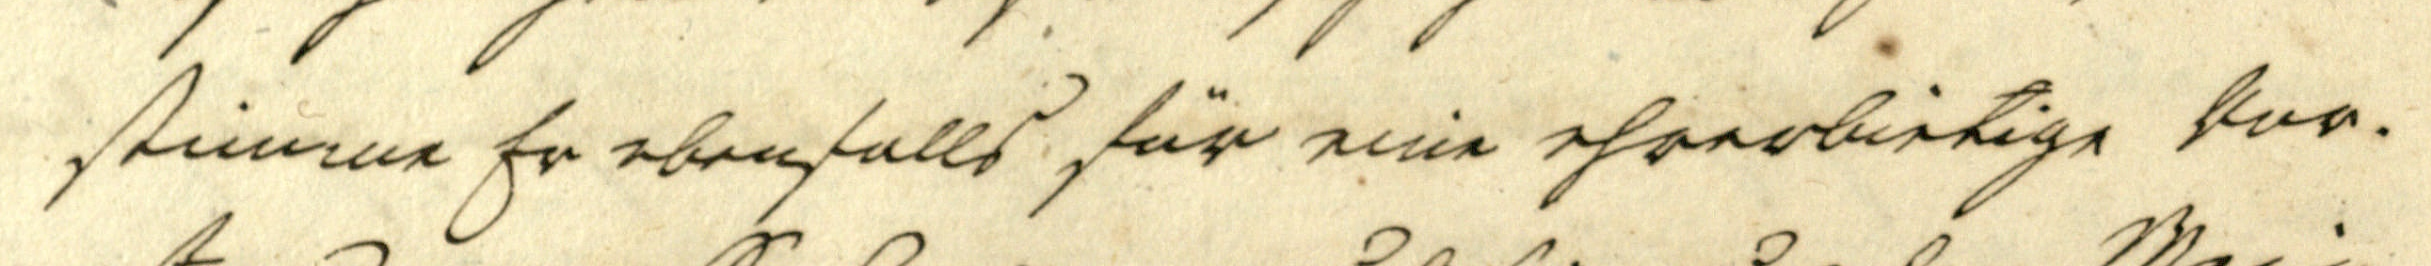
stimme Er ebenfalls für eine ehrerbietige Vor¬
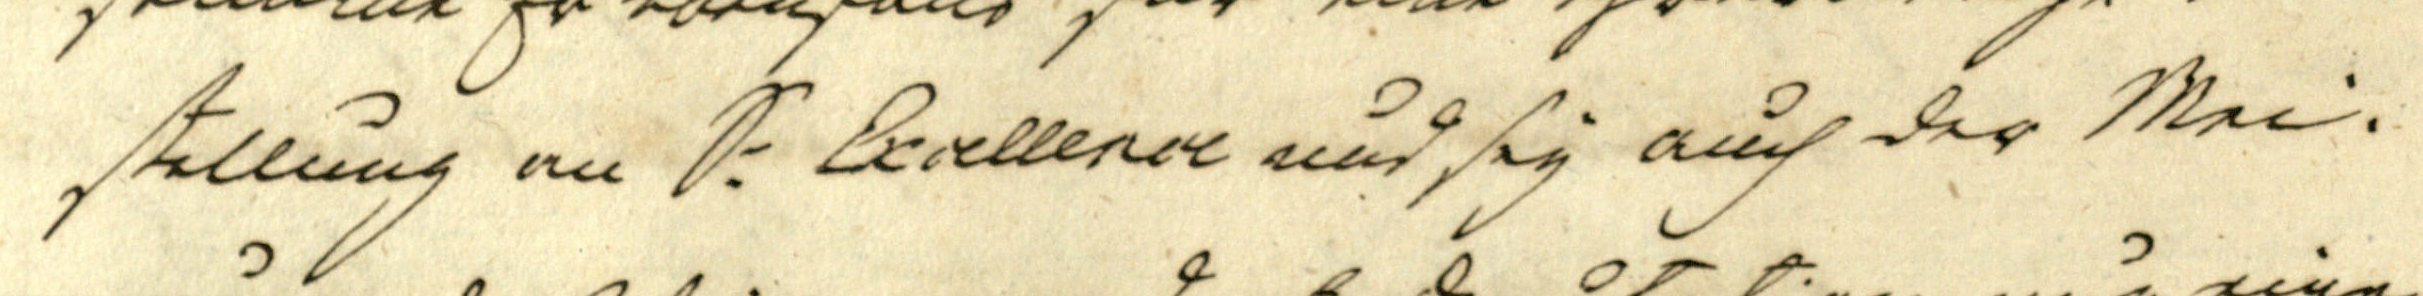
stellung an Sr. Excellence und seÿ auch der Mei¬
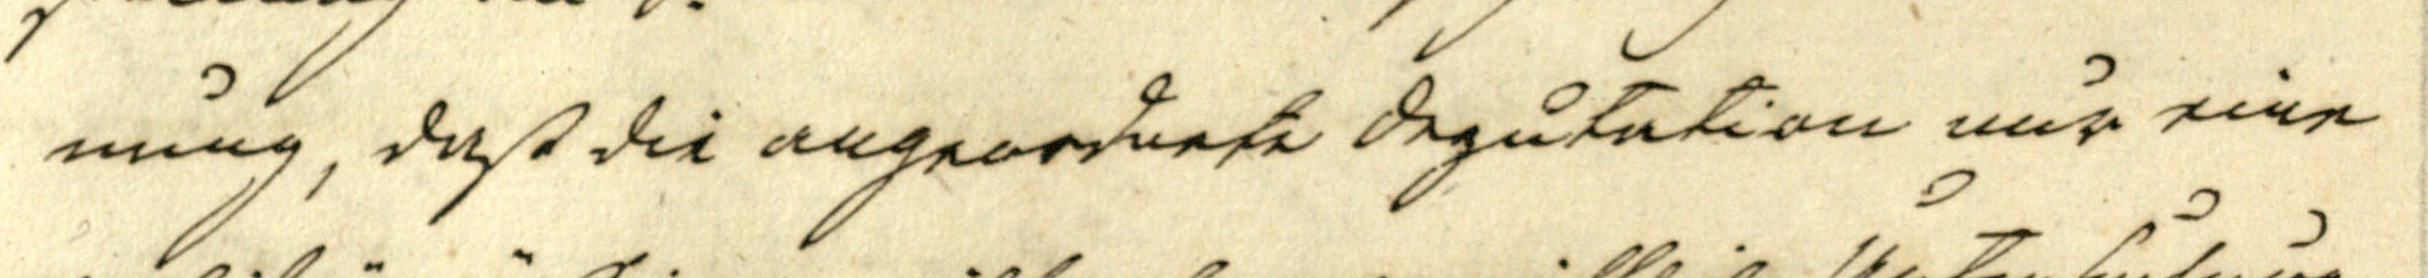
nung, daß die angeordnete Deputation nur eine
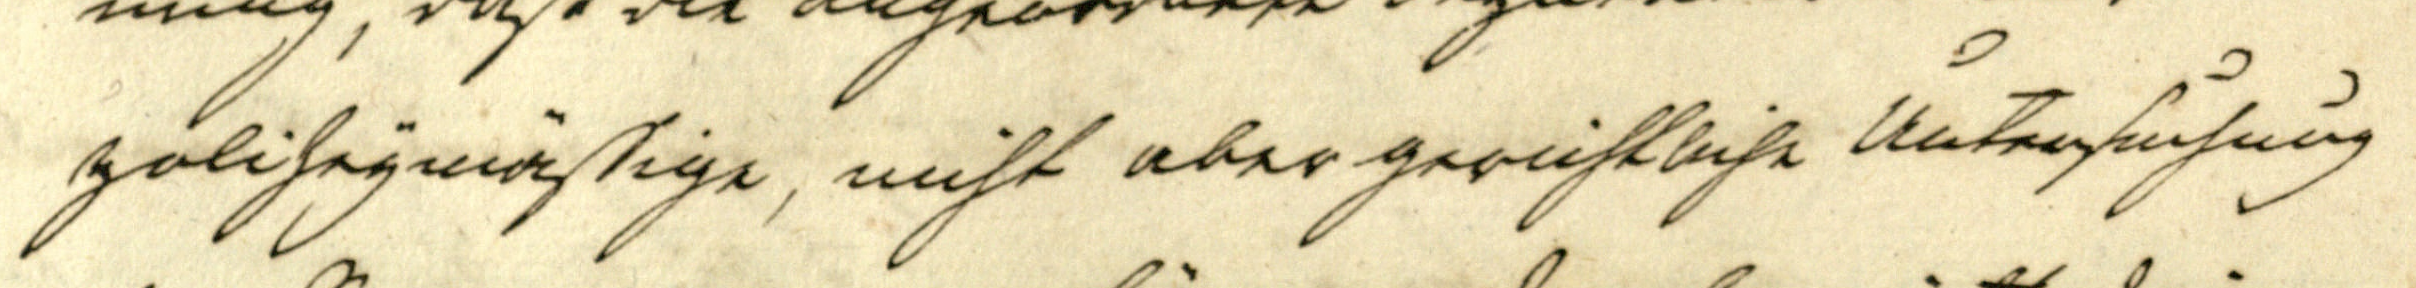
polizeÿmässige, nicht aber gerichtliche Untersuchung
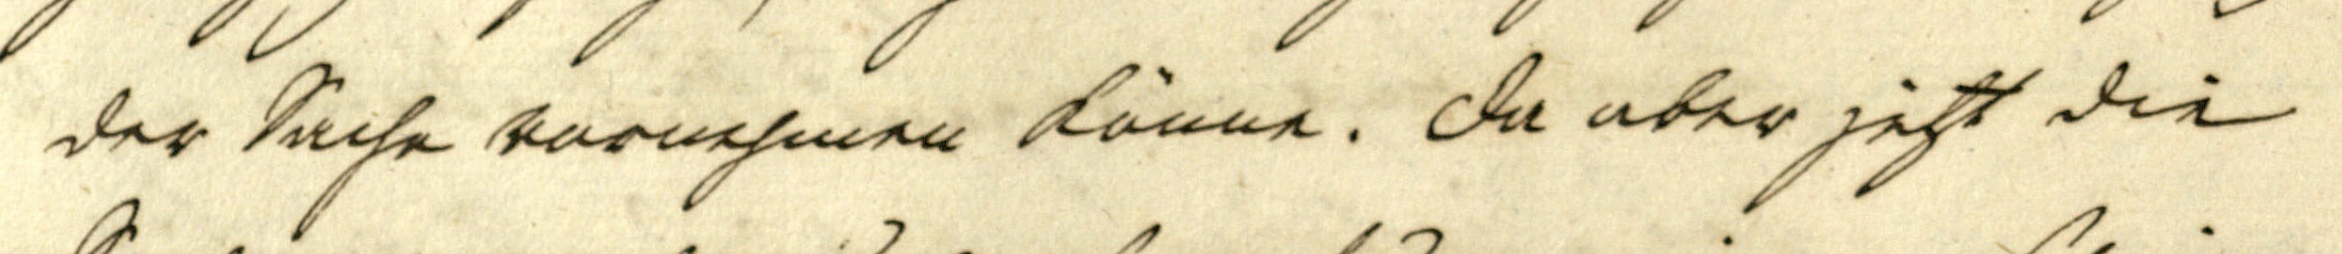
der Sache vornehmen könne. Da aber jetzt die
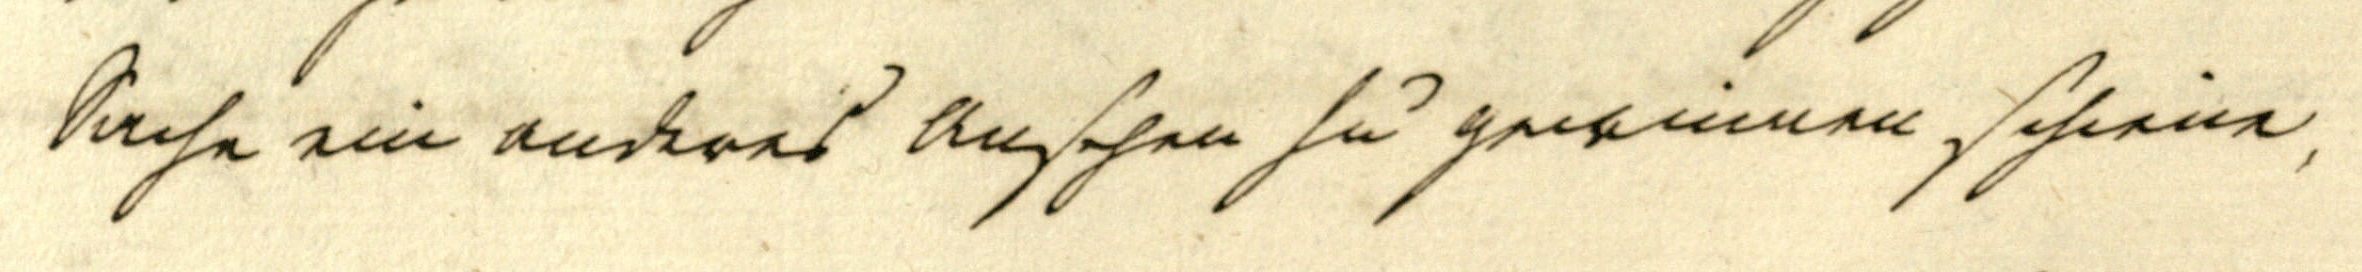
Sache ein anderes Ansehen zu gewinnen schiene
